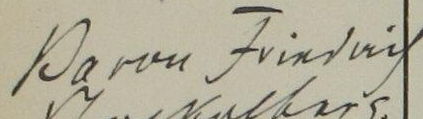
Baron Friedrich
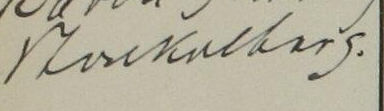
Stackelberg.
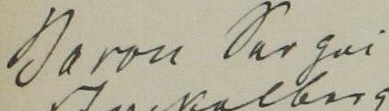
Baron Sergei
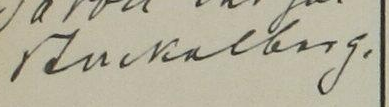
Stackelberg.
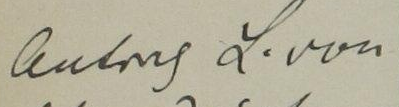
Antrag L. von
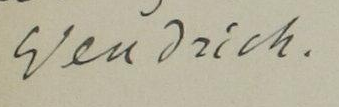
Wendrich
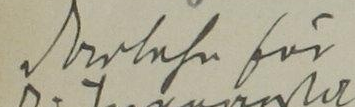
Darlehn für
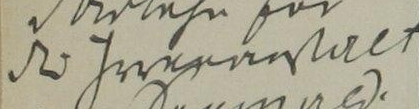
die Irrenanstalt
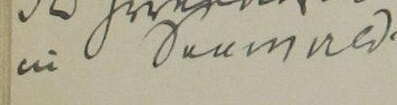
in Seewald
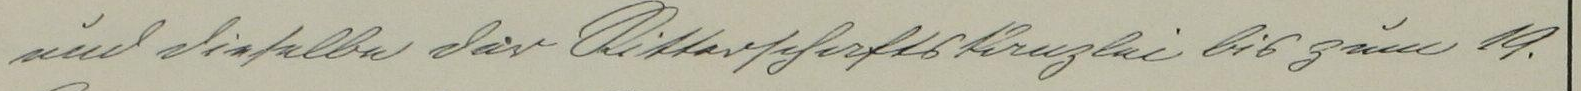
und dieselbe der Ritterschaftskanzlei bis zum 19.
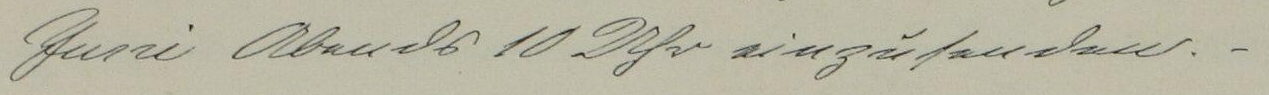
Juni Abends 10 Uhr einzusenden.
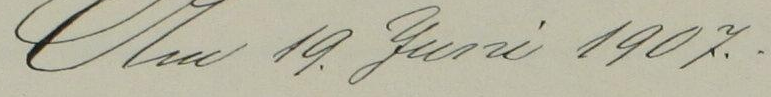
Am 19. Juni 1907.
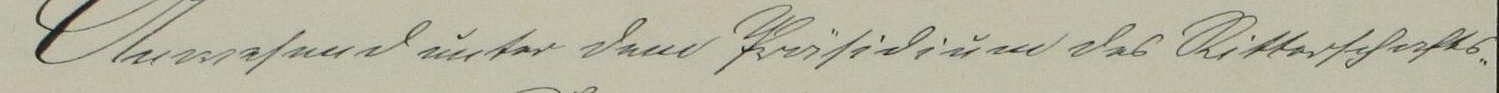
Anwesend unter dem Präsidium des Ritterschafts-
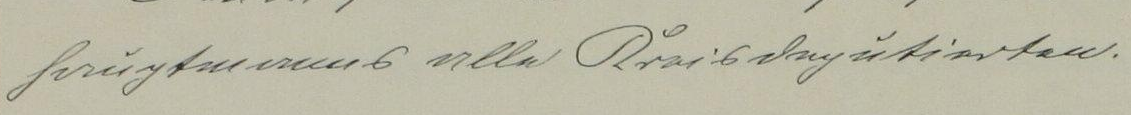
hauptmanns alle Kreisdeputierten.
